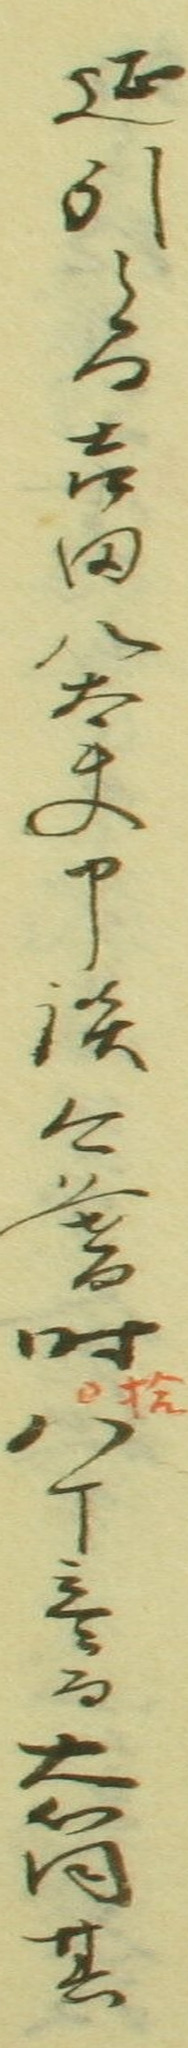延引候間吉田八太夫申談今暮時八十音而大筒其

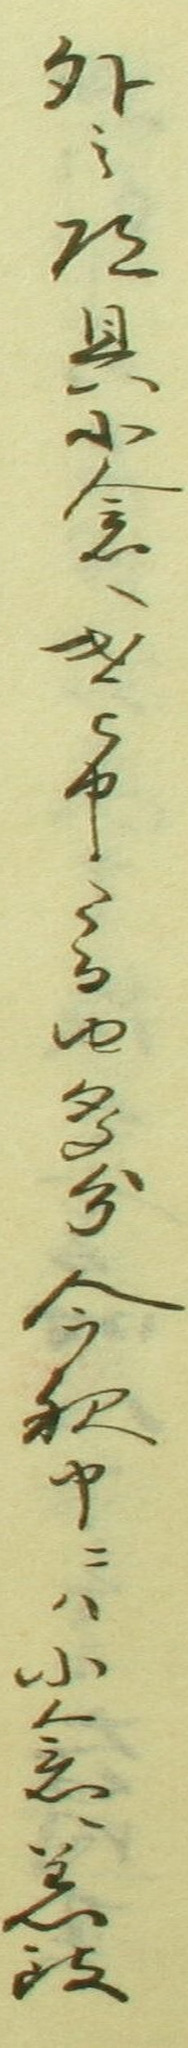外之道具小倉へ遣被申たる由多分今夜中ニは小倉へ着致
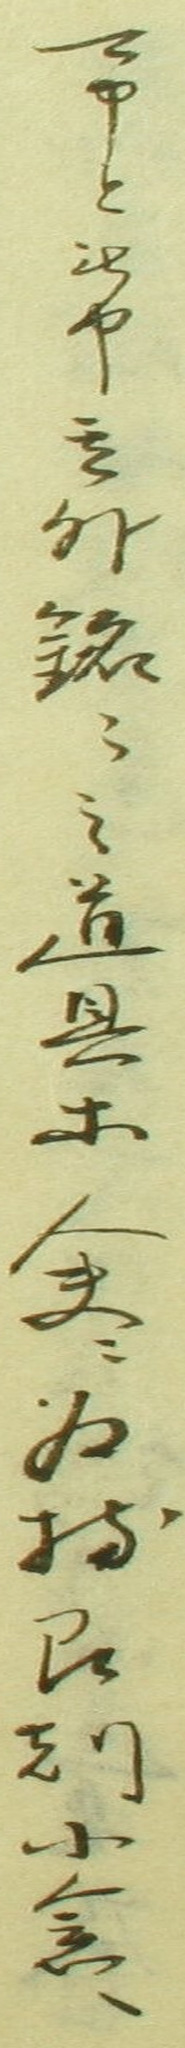可申と被申其外銘々之道具等人夫ニ為持即刻小倉へ
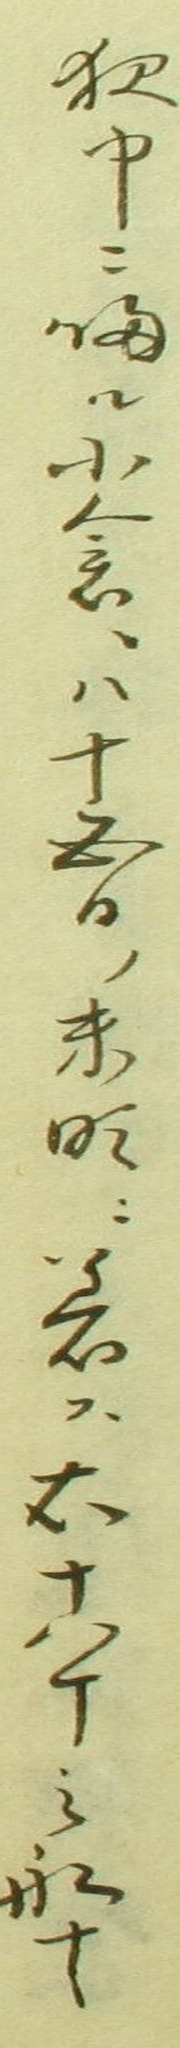夜中ニ帰候小倉へ八十五日ノ未明ニ着ス右十八丁之船は
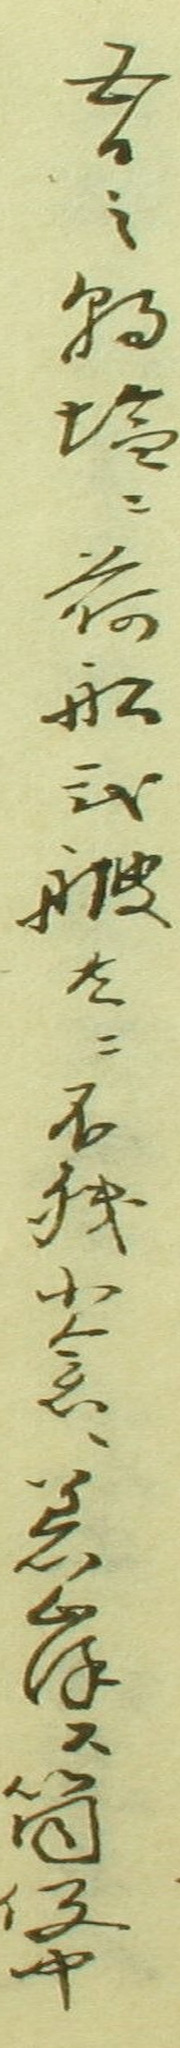五日之朝塩ニ荷船弐艘共ニ不残小倉へ着岸ス筒役中
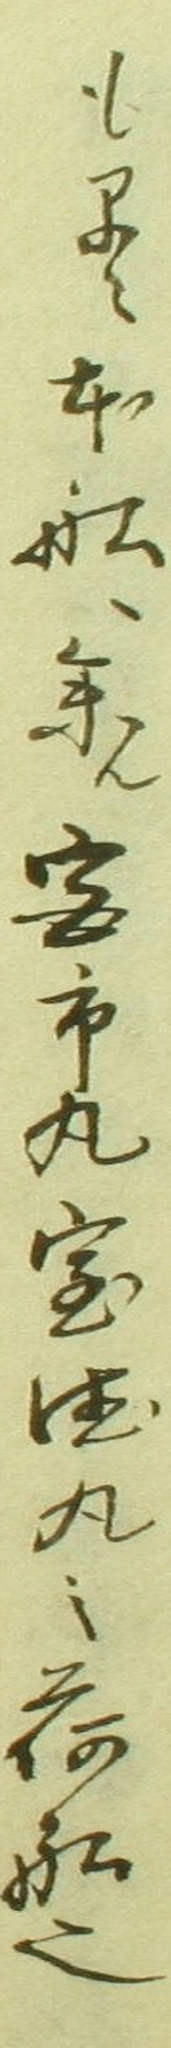も早々本船へ乗る宮市丸宝徳丸之荷船也
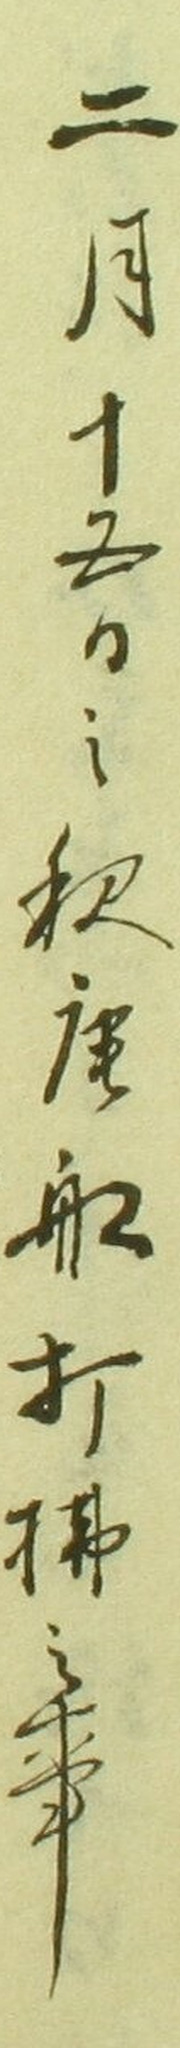二月十五日之夜唐船打払之事
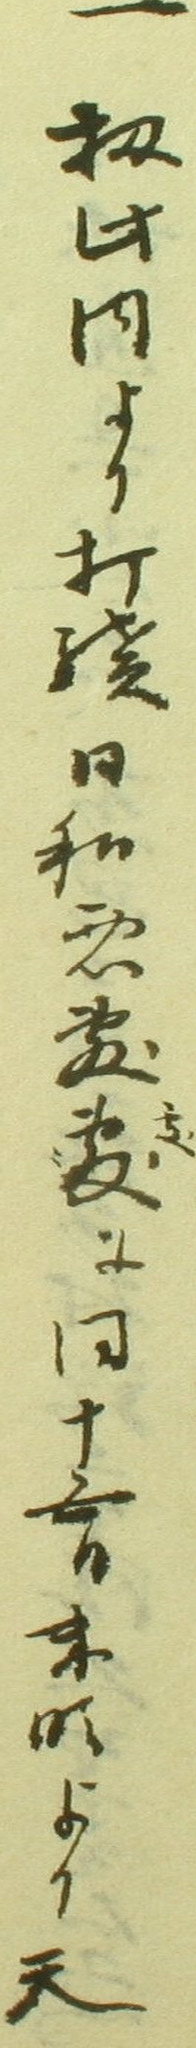一扨此内より打続日和悪敷処に同十五日未明より天
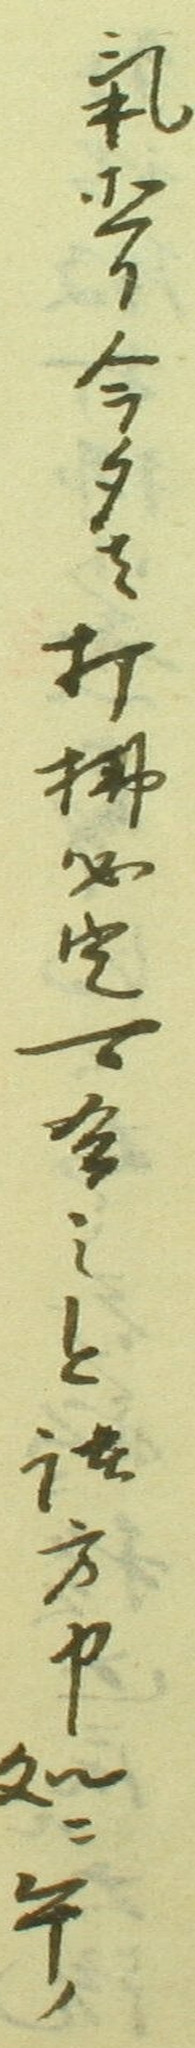気直り今夕は打払必定可有之と陸方申処ニ午ノ
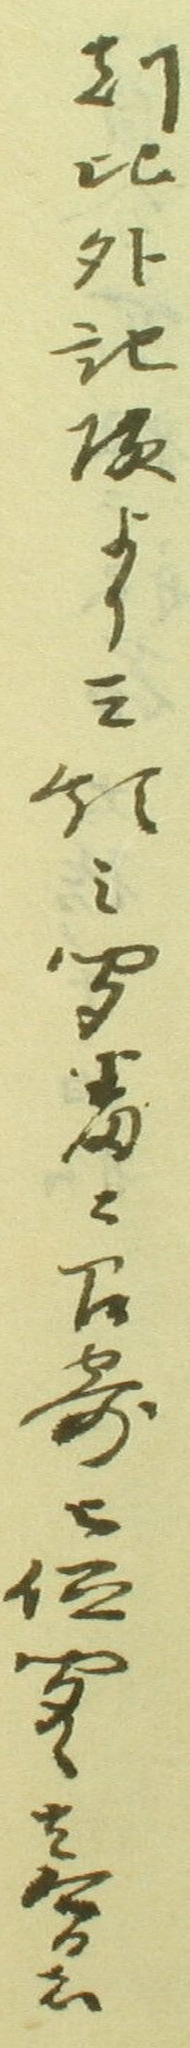刻頃外記殿より三領之聞番被召寄被仰聞候は今日は
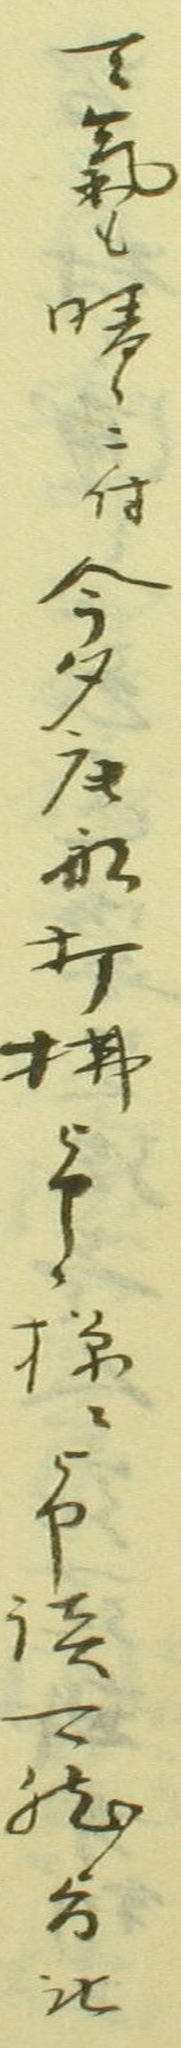天気も晴候ニ付今夕唐船打払被申候様ニ被申談可然旨被
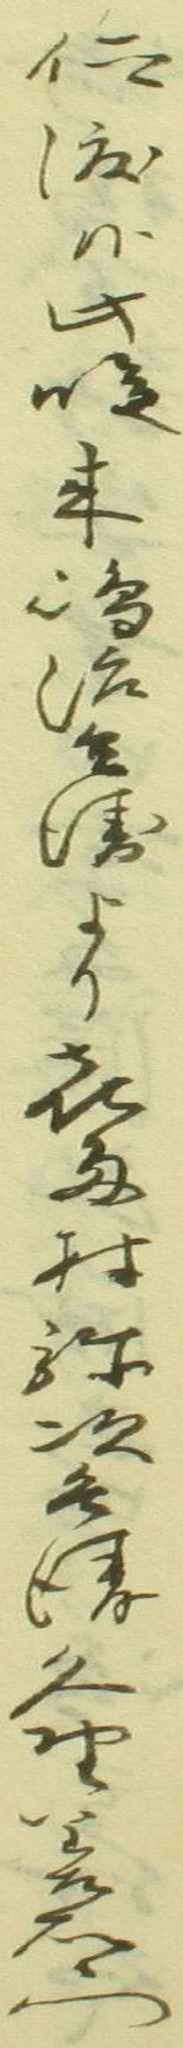仰渡候此段来島治兵衛より喜多村弥次兵衛久野善右衛門
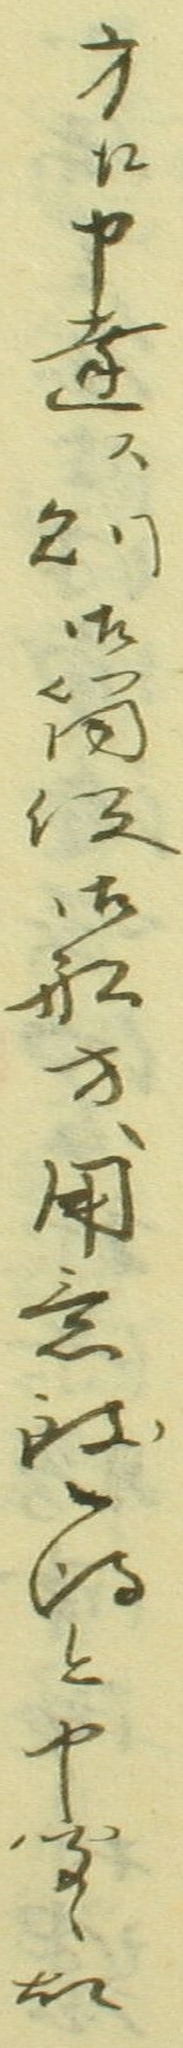方江申達ス則御筒役御船方へ用意致候得と申聞候故
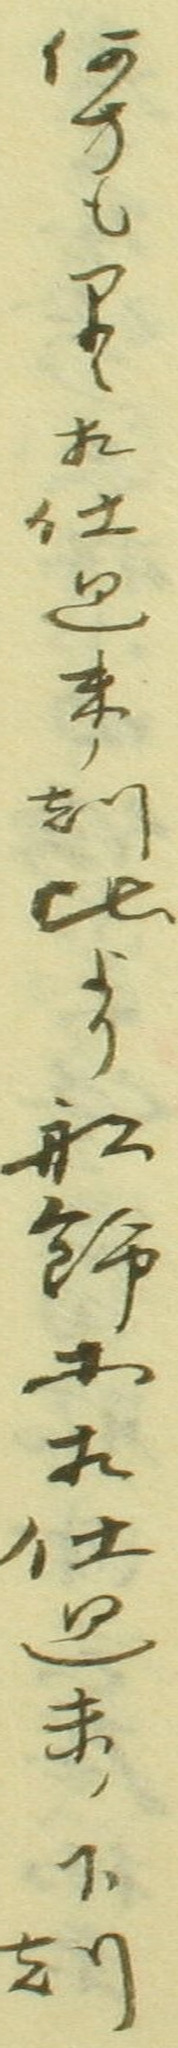何方も早々相仕廻未ノ刻頃より船飾等相仕廻未ノ下刻
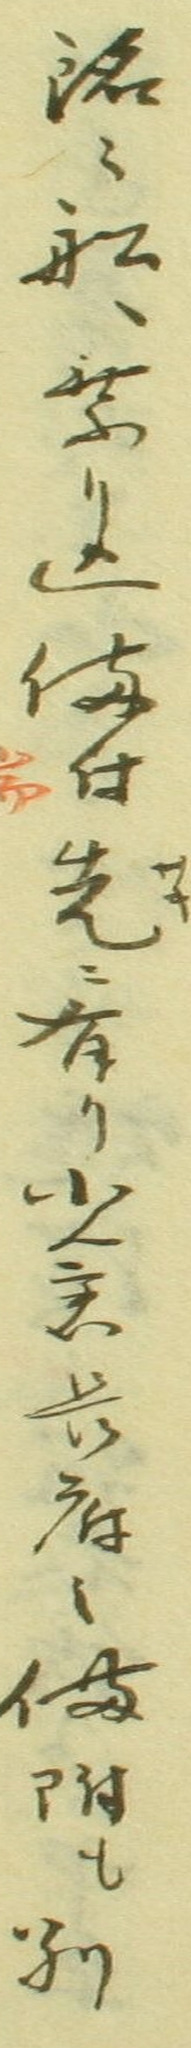銘々船へ乗り込備付先ニ有り小倉長府之備附も別
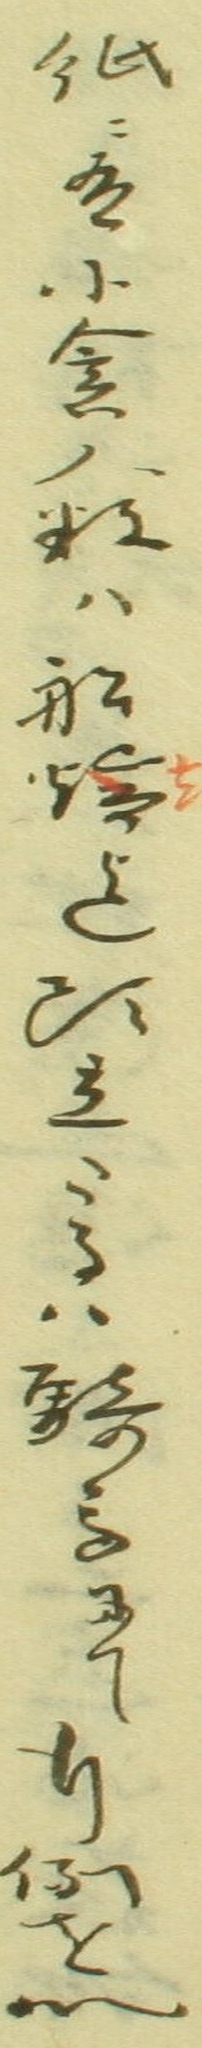紙に有小倉人数は船端迄頭立たるは騎馬にて行例を以
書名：唐船漂流記 二
